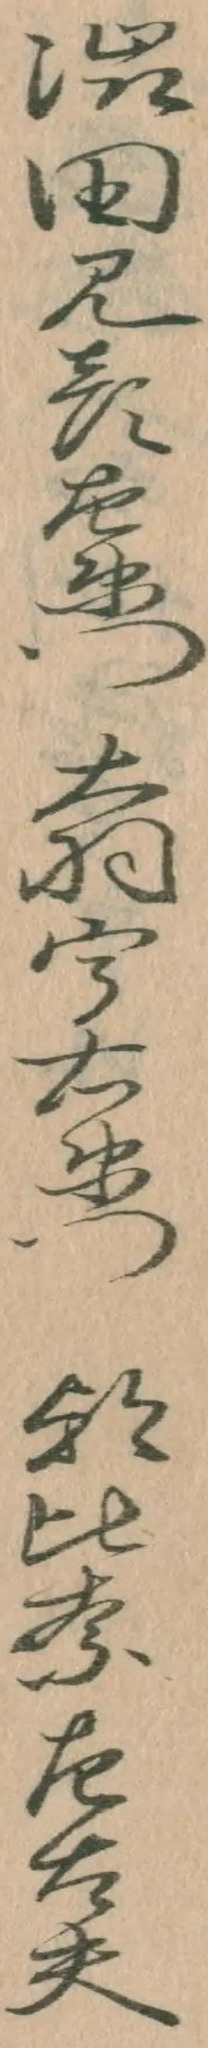渋田見彦左衛門大羽宇右衛門朝比奈左太夫
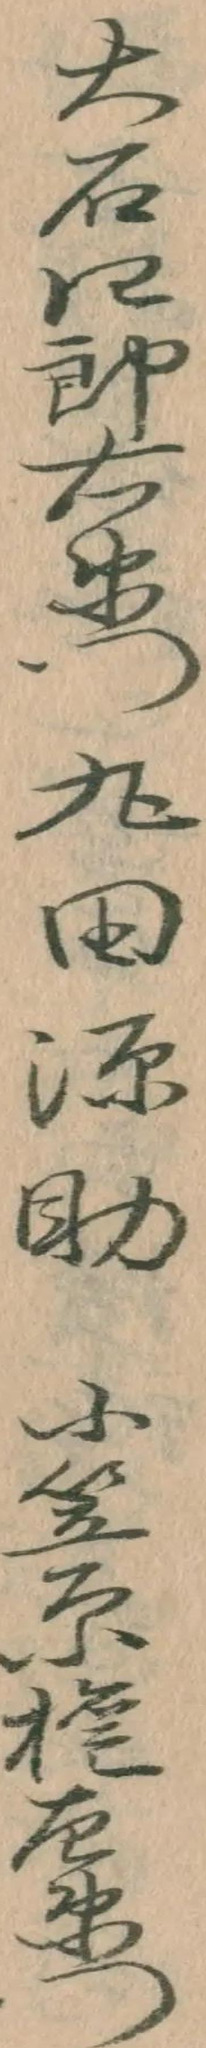大石四郎右衛門丸田源助小笠原権左衛門
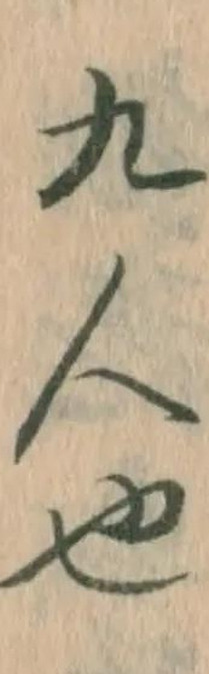九人也
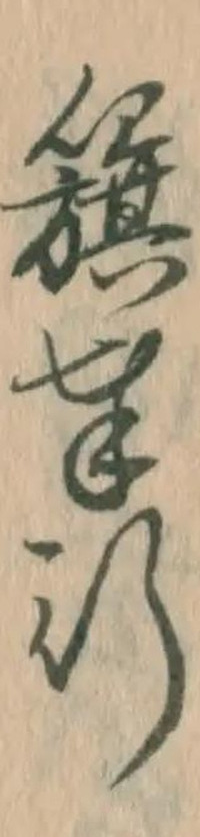籏奉行
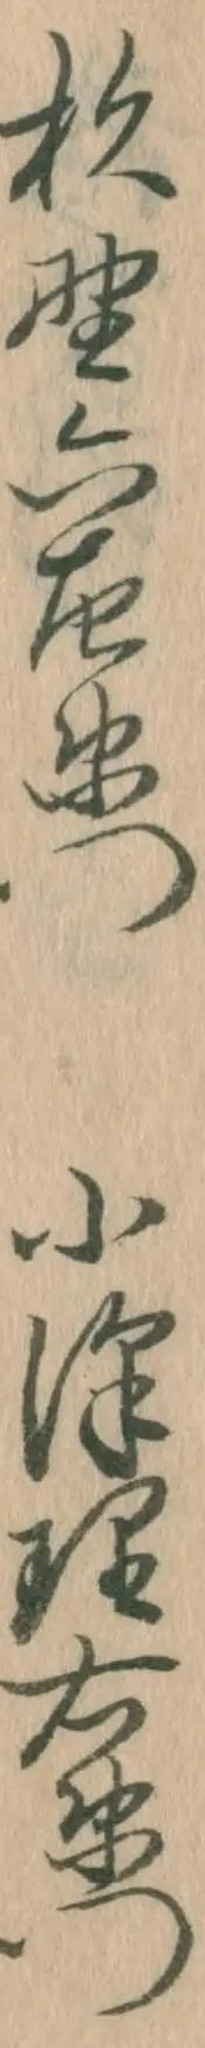杉野六左衛門小沢理右衛門
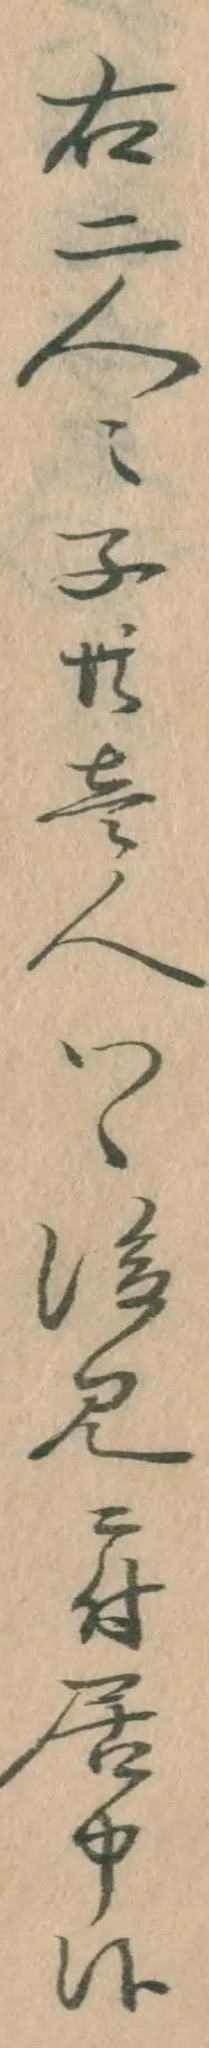右二人之子共壱人つゝ後見に付居申候
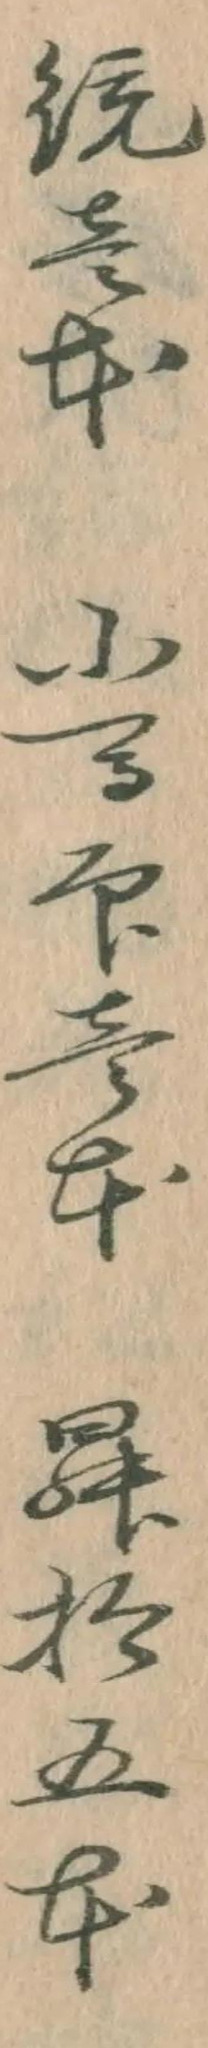統壱本小馬印壱本昇拾五本
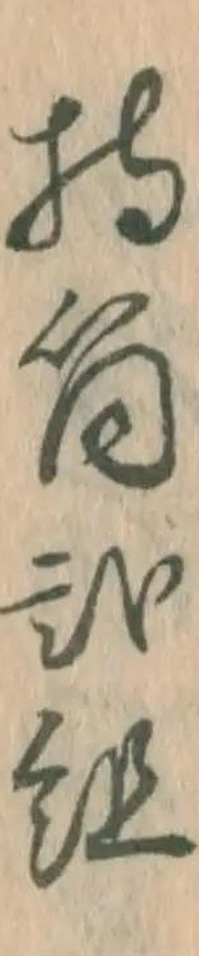持筒弐組
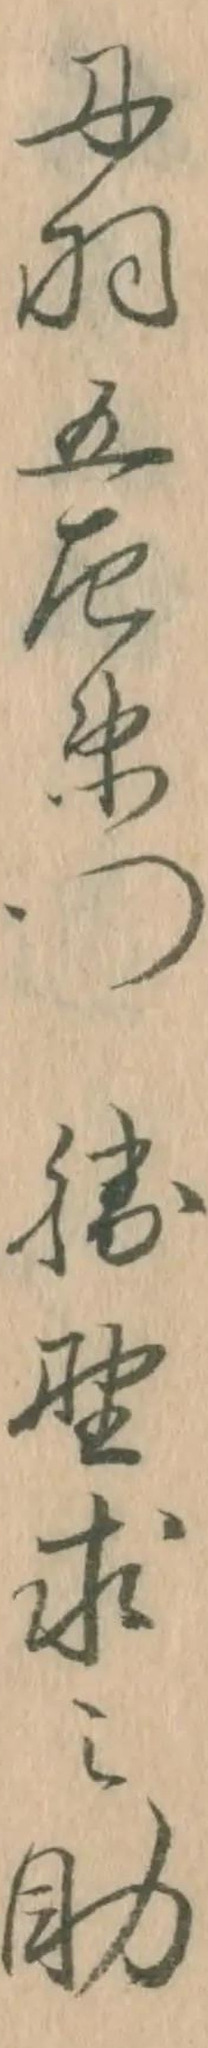丹羽五左衛門勝野求之助

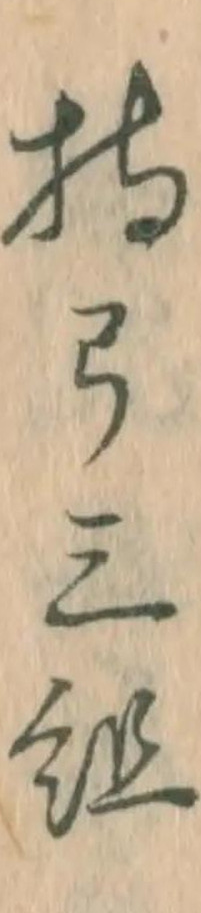持弓三組
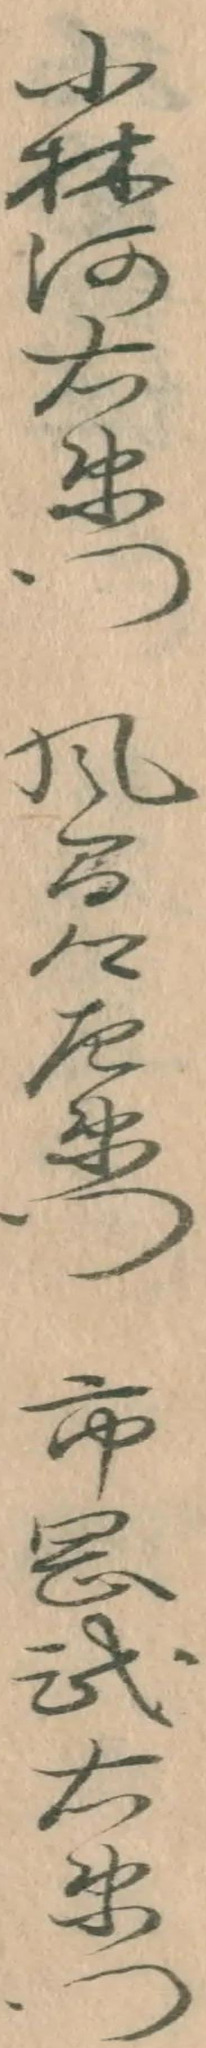小林河右衛門風呂郷左衛門市岡武右衛門
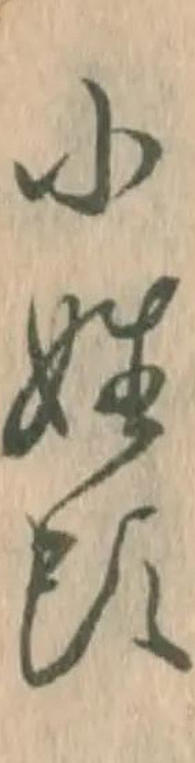小姓頭
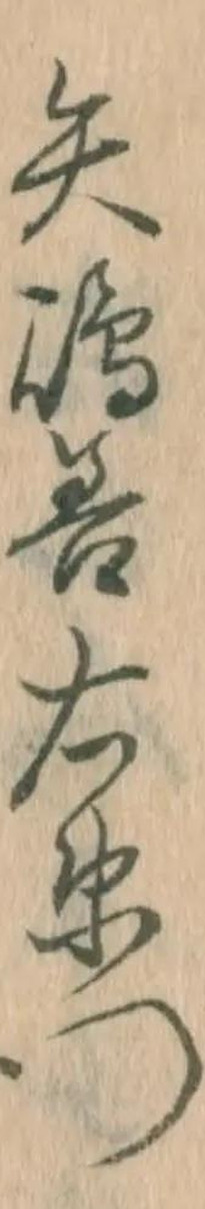矢島善右衛門
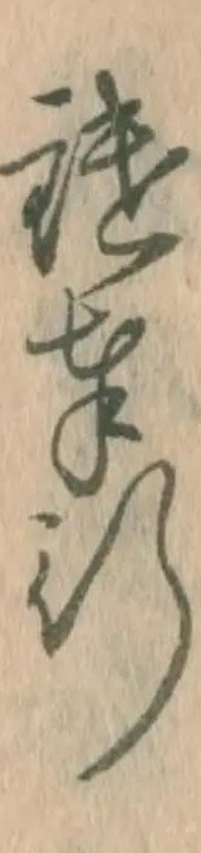鑓奉行
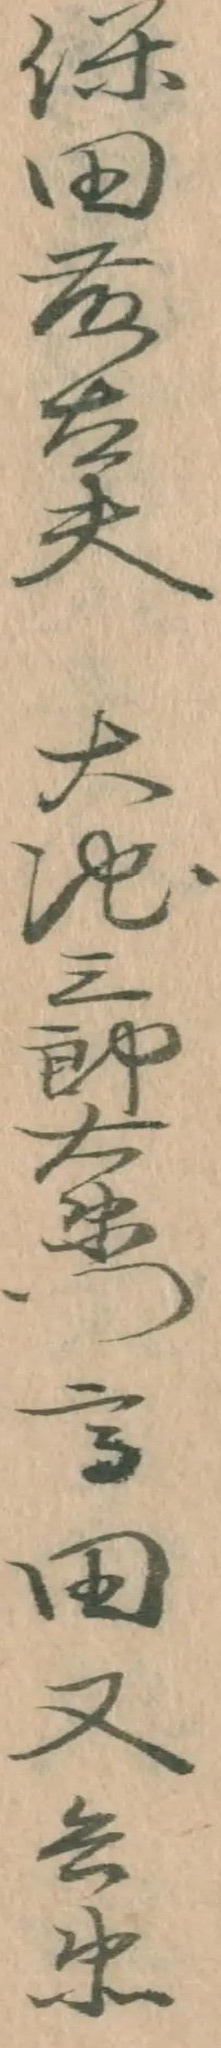保田藤太夫大池三郎右衛門高田又兵衛
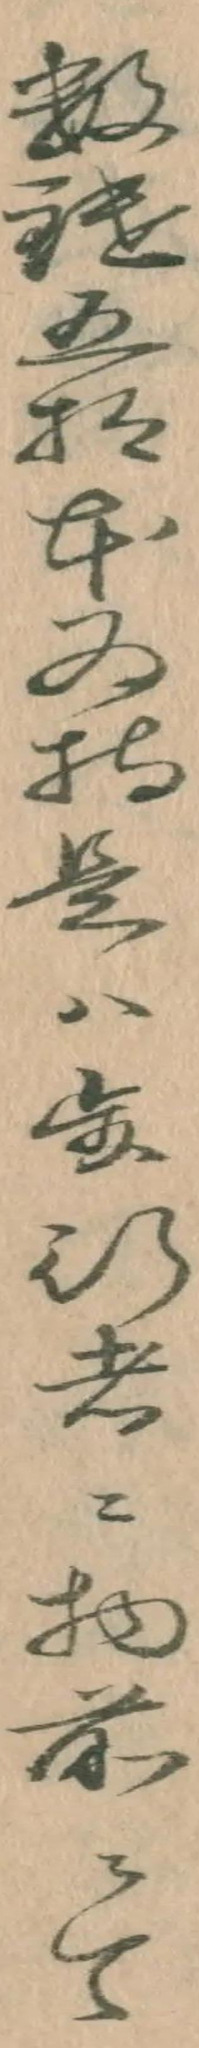数鑓五拾本ゐ持是は歩行者に物前にて
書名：切支丹御退治記 49巻. [6]
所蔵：国立国会図書館 National Diet Library, JAPAN
